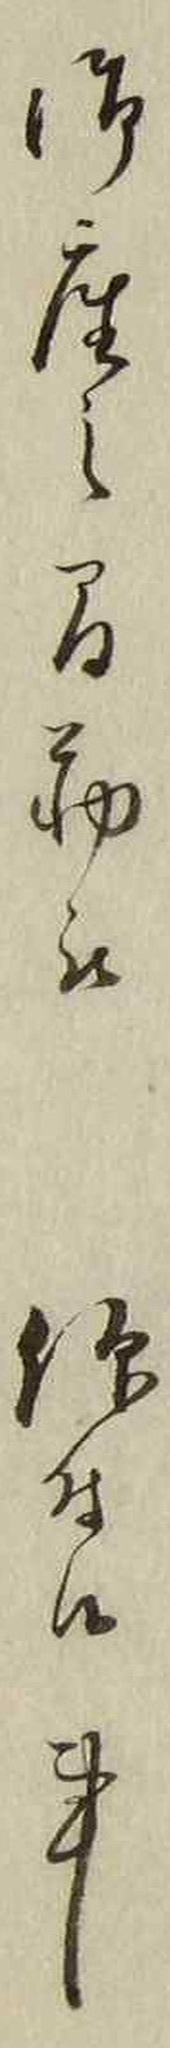御座之間勤被仰付候事
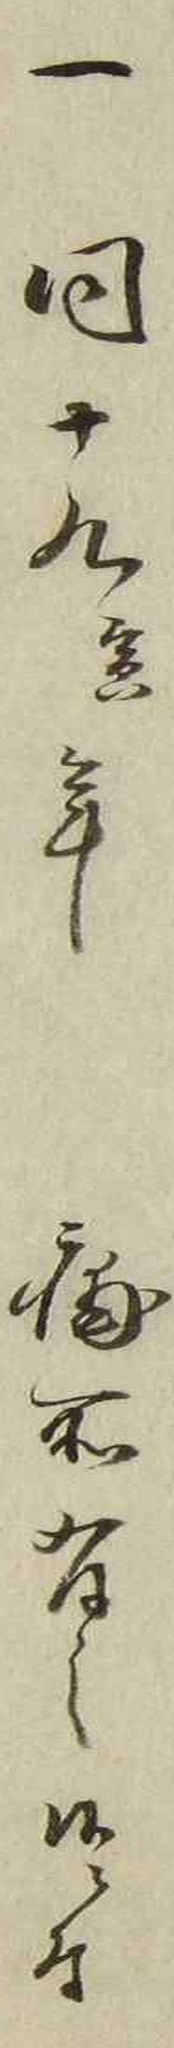一同十九寅年痛所有之候ニ付
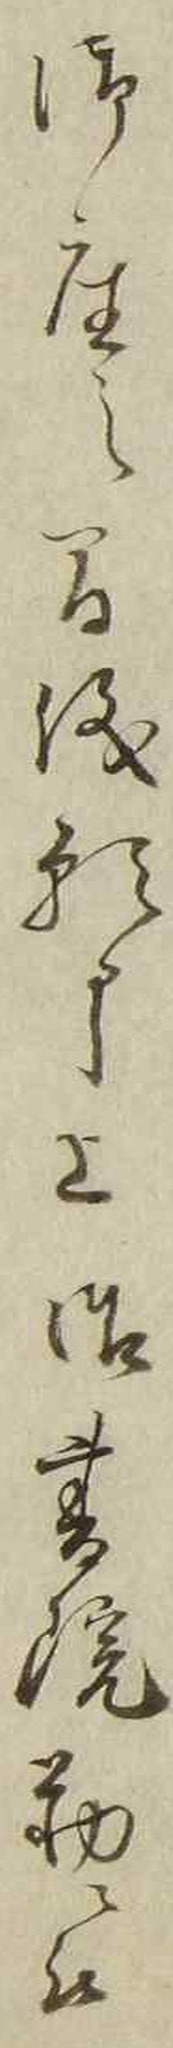御座之間儀願申上御書院勤ニ被

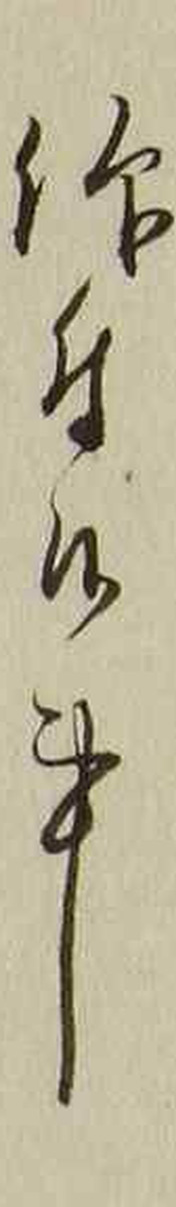仰付候事
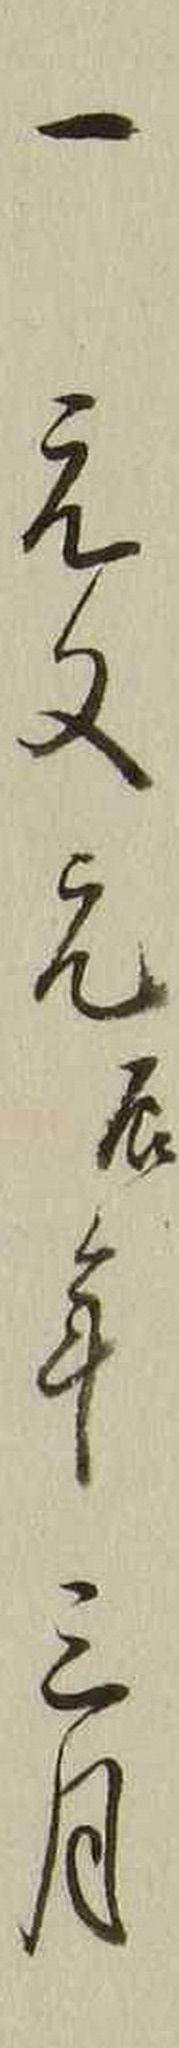一元文元辰年三月
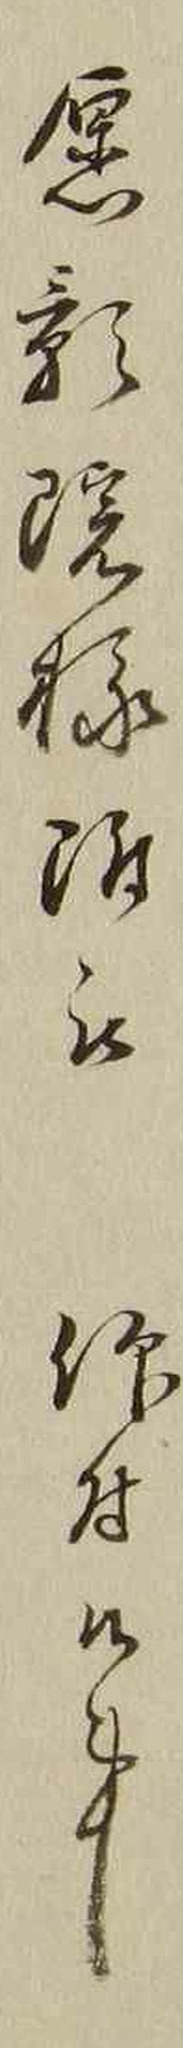愿彰院様附被仰付候事
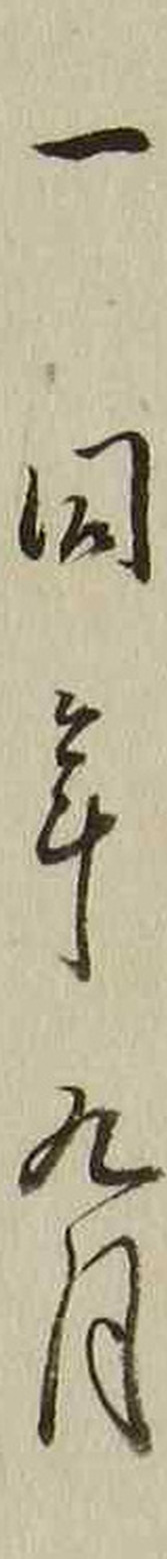一同年九月
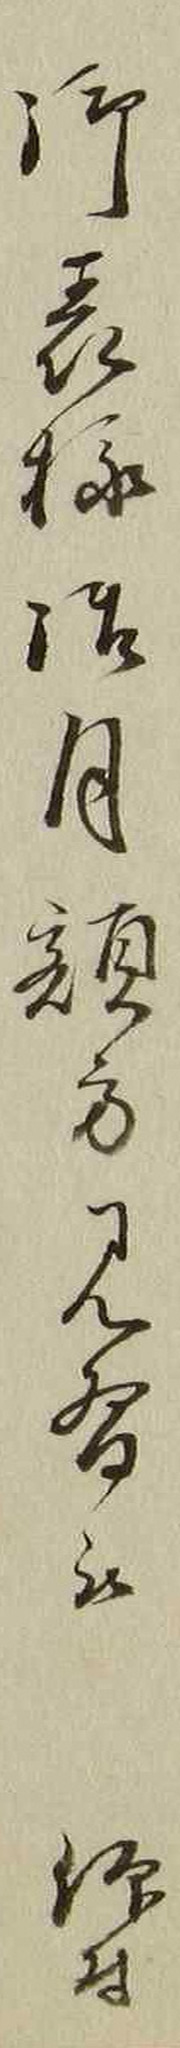御表様御月額方見習被仰付
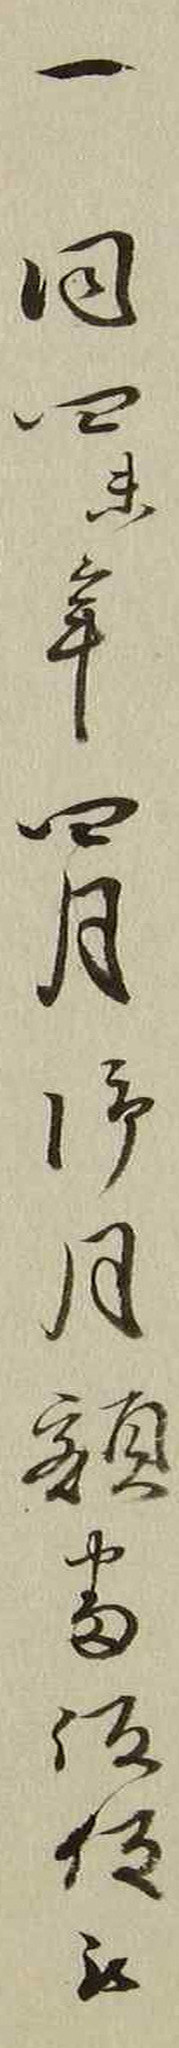一同四未年四月御月額番仮役被
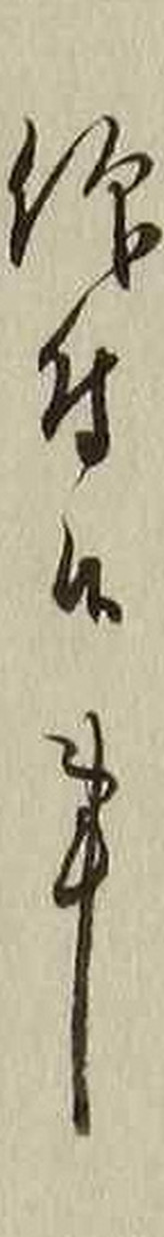仰付候事
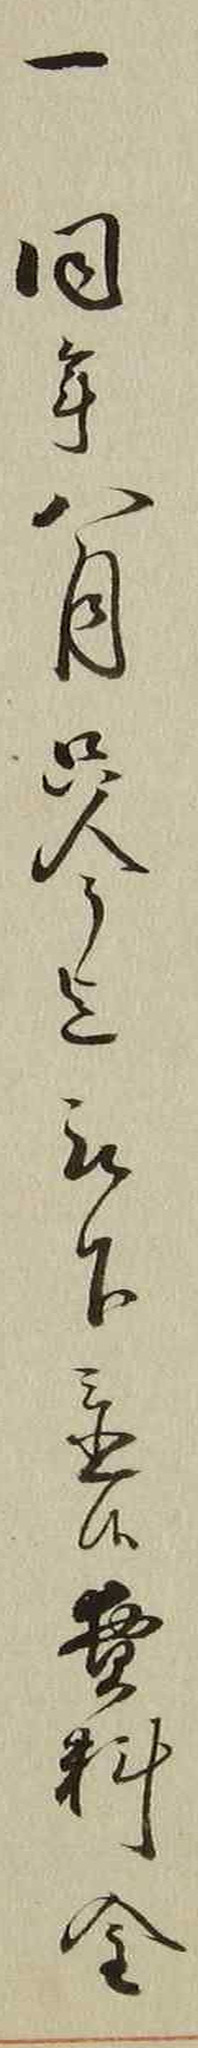一同年八月只今迄被下置候費料金
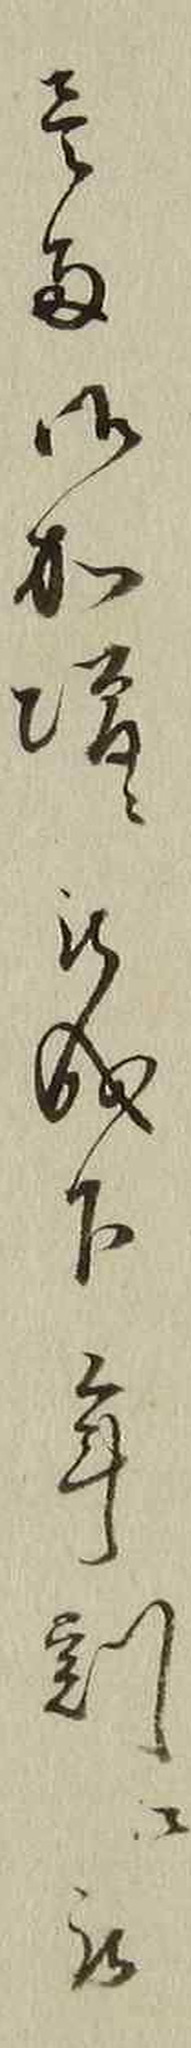壱両御加増ニ被成下年割ニ被
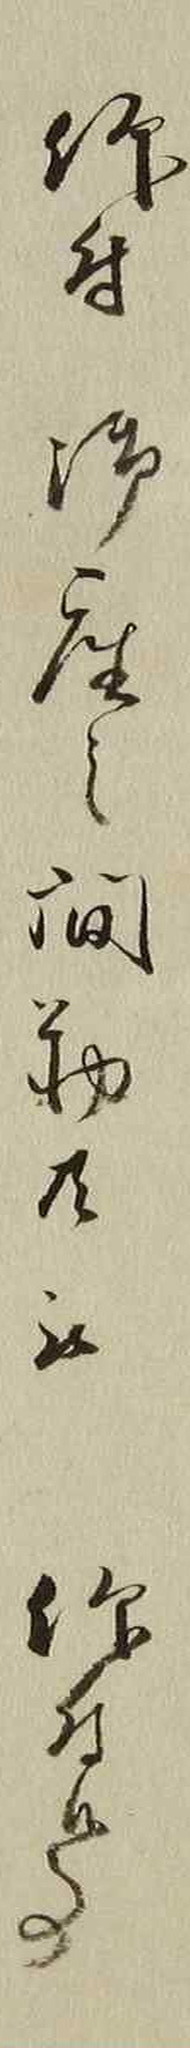仰付御座之間勤共被仰付候事
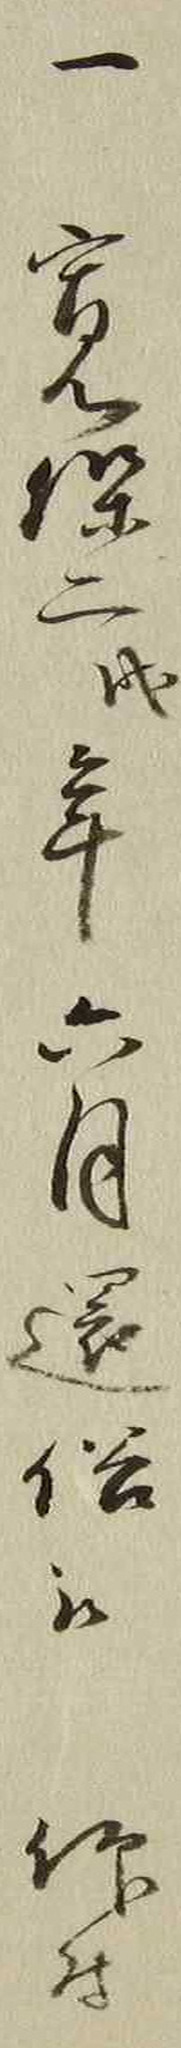一寛保二戌年六月還俗被仰付
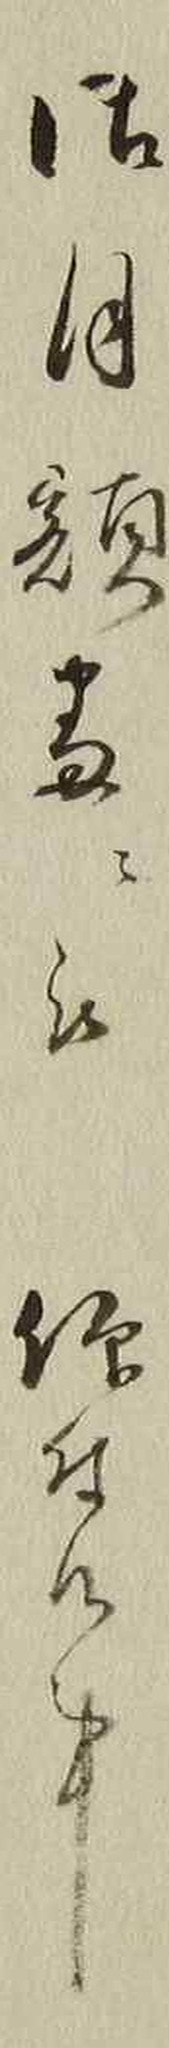御月額番ニ被仰付候事
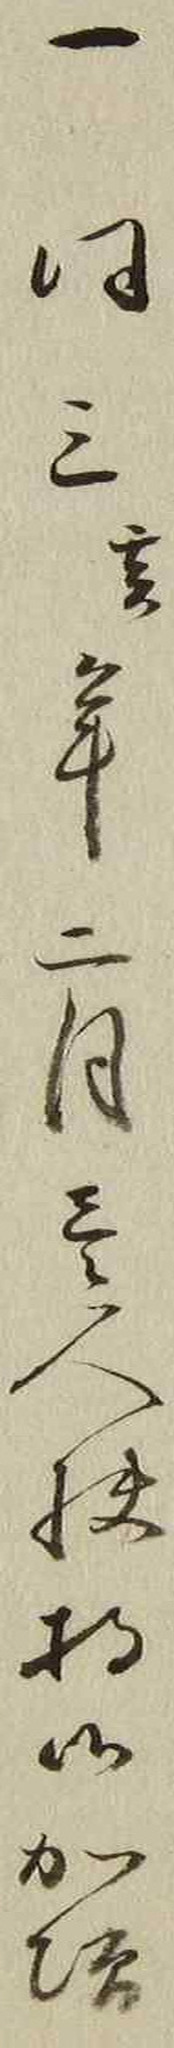一同三亥年二月壱人扶持御加増
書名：諸士系譜　巻之32　い之部32
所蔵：会津若松市立会津図書館
